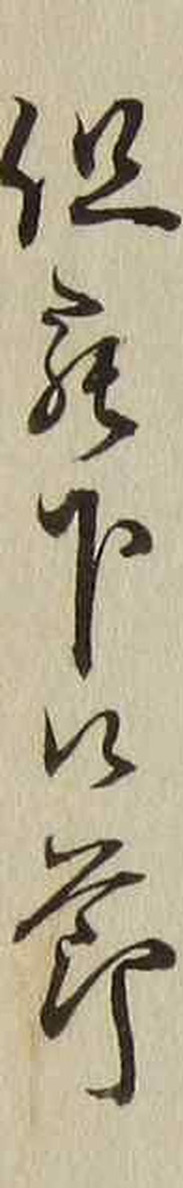但罷下候節
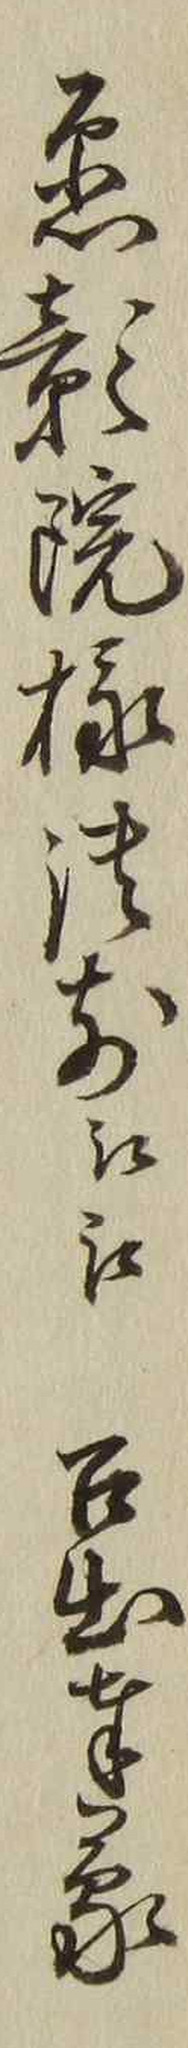愿彰院様御前江被召出奉蒙
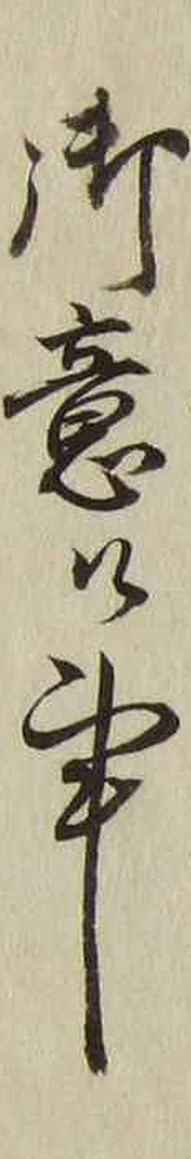御意候事

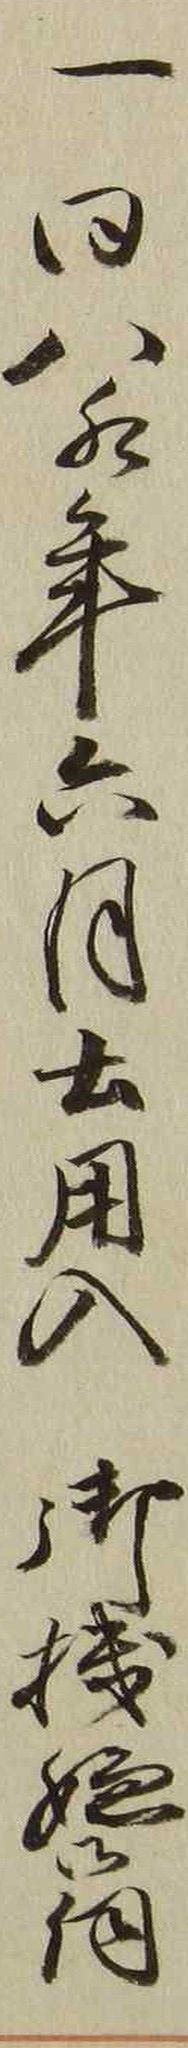一同八卯年六月土用入御機嫌御伺
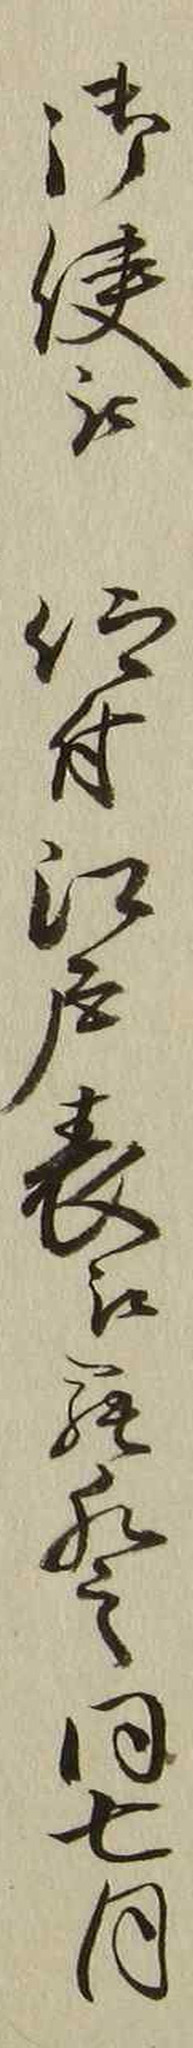御使被仰付江戸表江罷登同七月
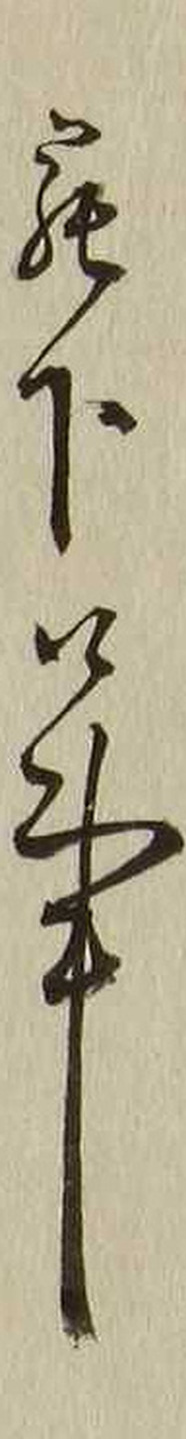罷下候事
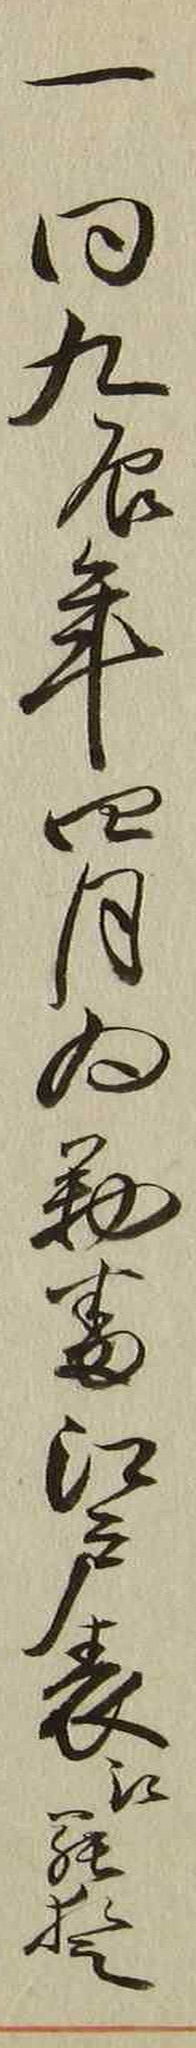一同九辰年四月為勤番江戸表江罷登
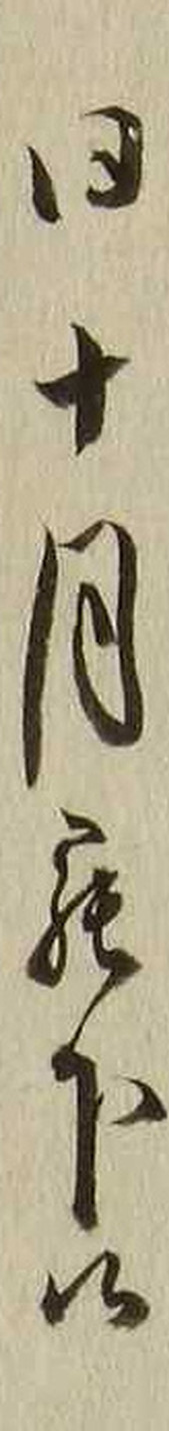同十月罷下候
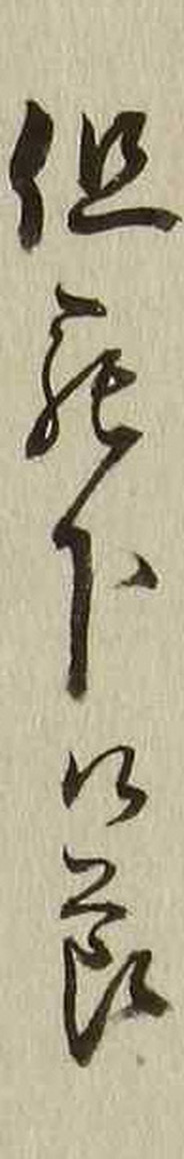但罷下候節
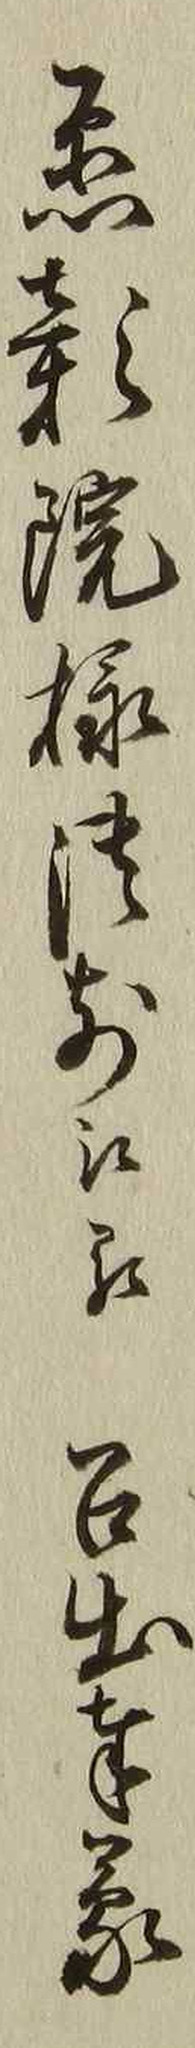愿彰院様御前江被召出奉蒙
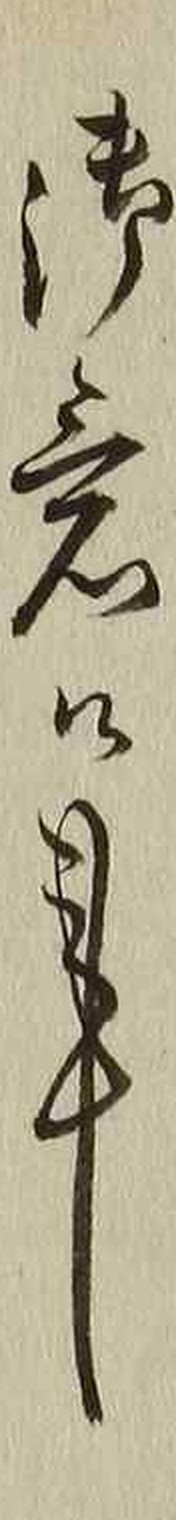御意候事
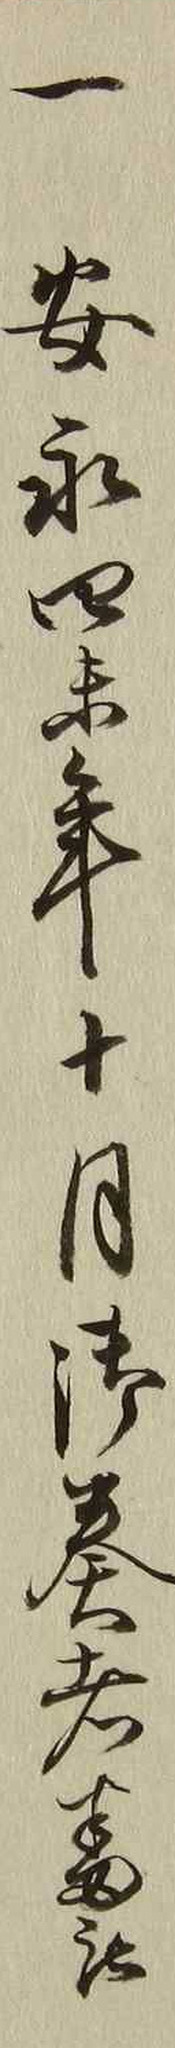一安永四未年十月御奏者番被
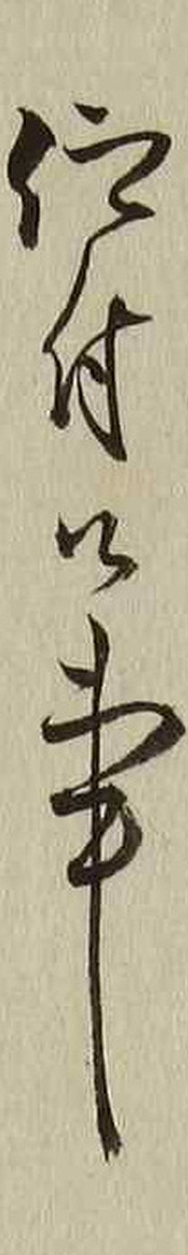仰付候事
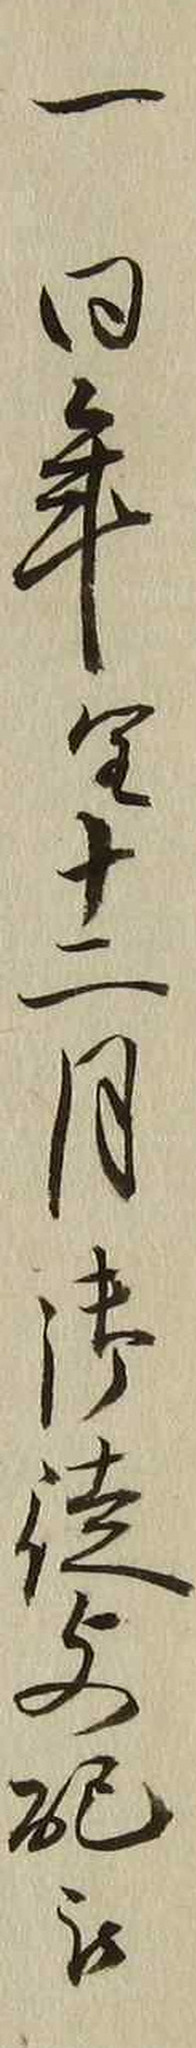一同年閏十一月御徒支配被
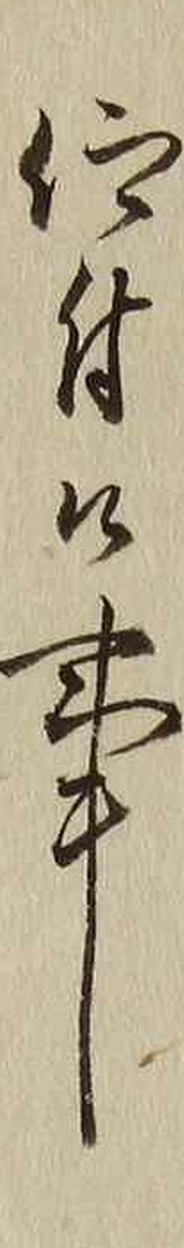仰付候事
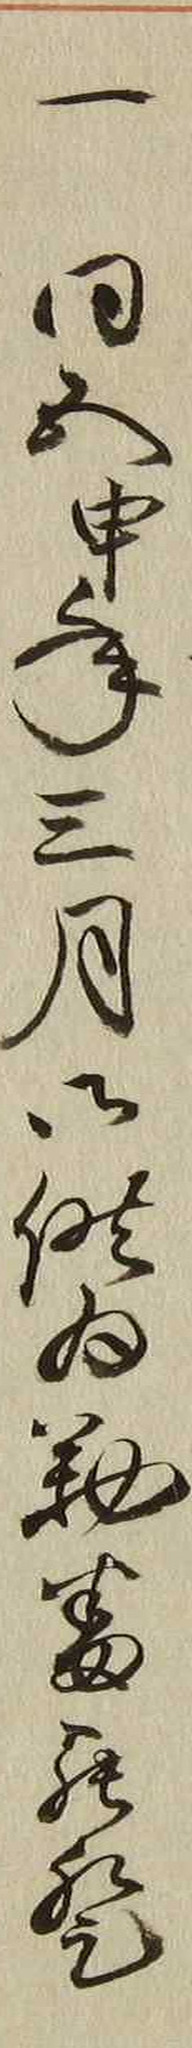一同五申年三月御供為勤番罷登
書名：諸士系譜　巻之60　と之部3
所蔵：会津若松市立会津図書館
